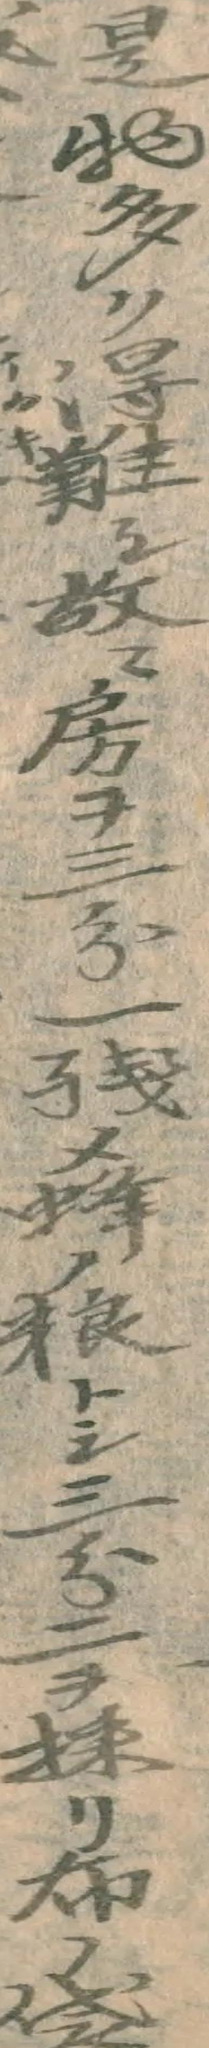是物多ク得難シ故ニ房ヲ三分一残シテ蜂ノ粮トシ三分二ヲ採リ布ノ袋
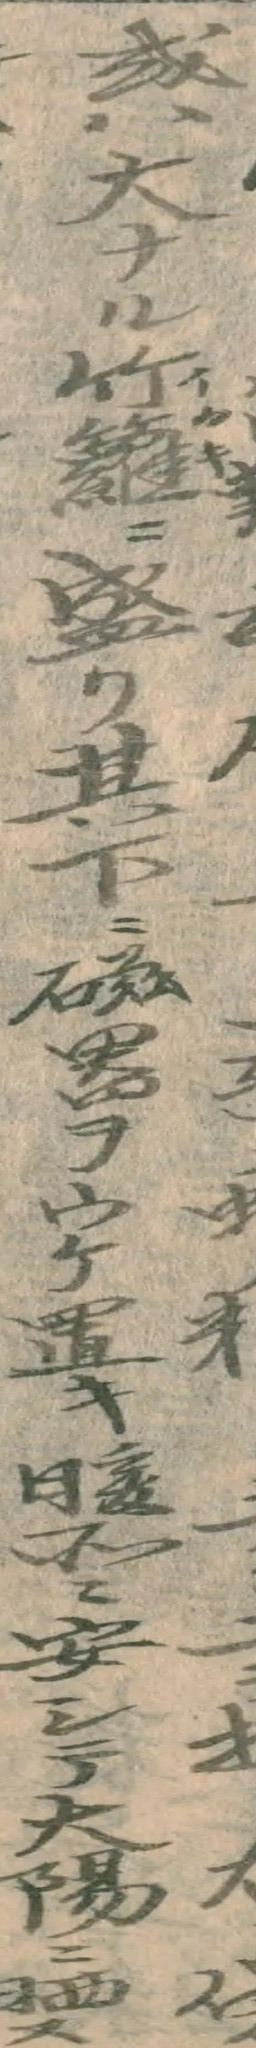或ハ大ナル竹籮ニ盛リ其下ニ磁器ヲウケ置キ暖所ニ安シテ大陽ニ晒ス
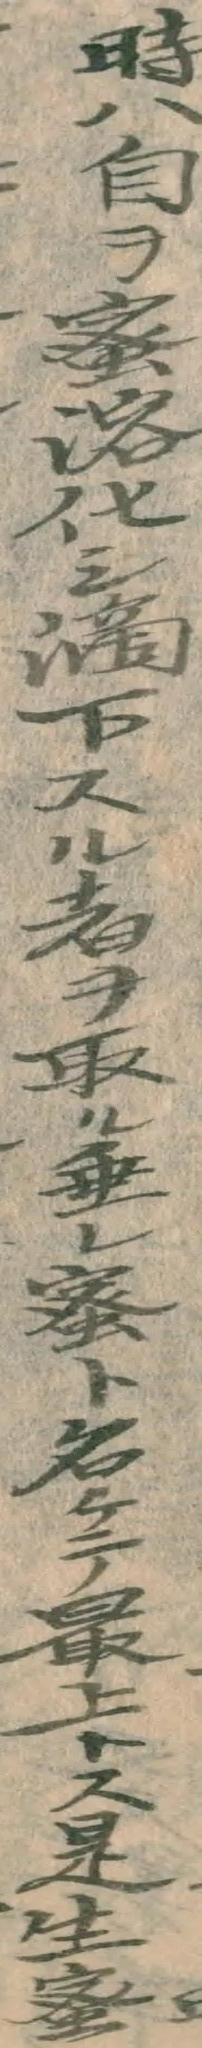時ハ自ラ蜜溶化シ滴下スル者ヲ取ル垂レ蜜ト名ケテ最上トス是生蜜
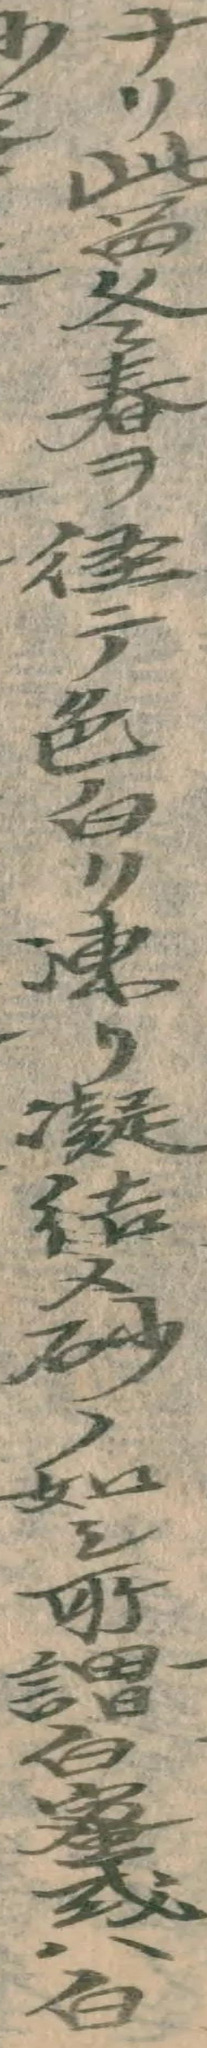ナリ此品冬春ヲ径テ色白ク凍リ凝結シテ砂ノ如シ所謂白蜜或ハ白
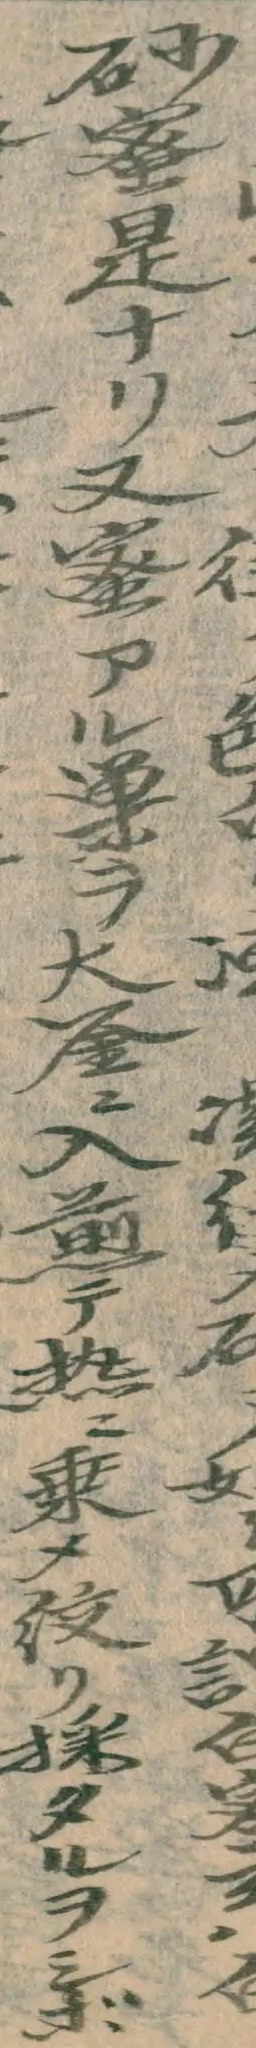砂蜜是ナリ又蜜アル巣ヲ大釜ニ入煎テ熱ニ乗シテ絞リ採タルヲシボ
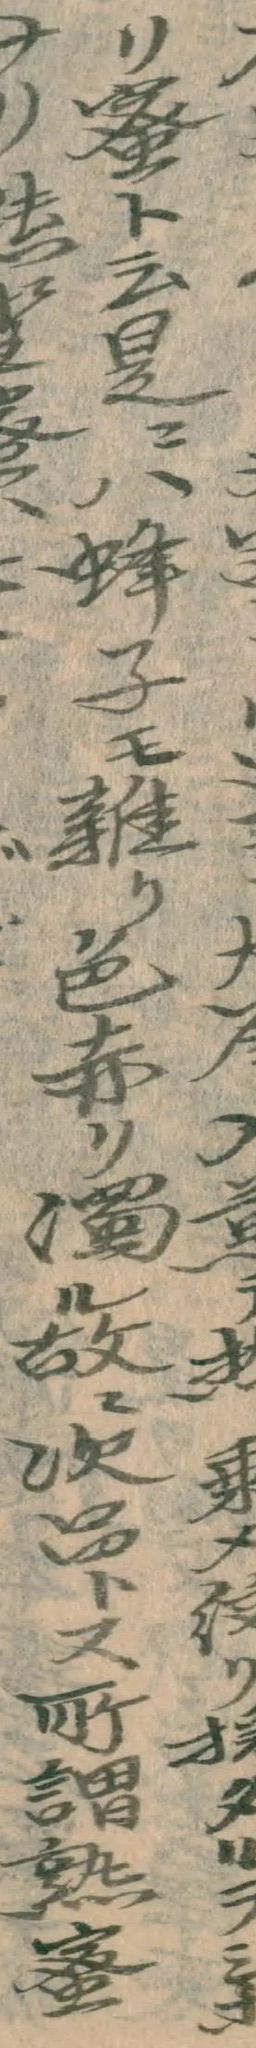リ蜜ト云是ニハ蜂子モ雑リ色赤ク濁ル故ニ次品トス所謂熟蜜
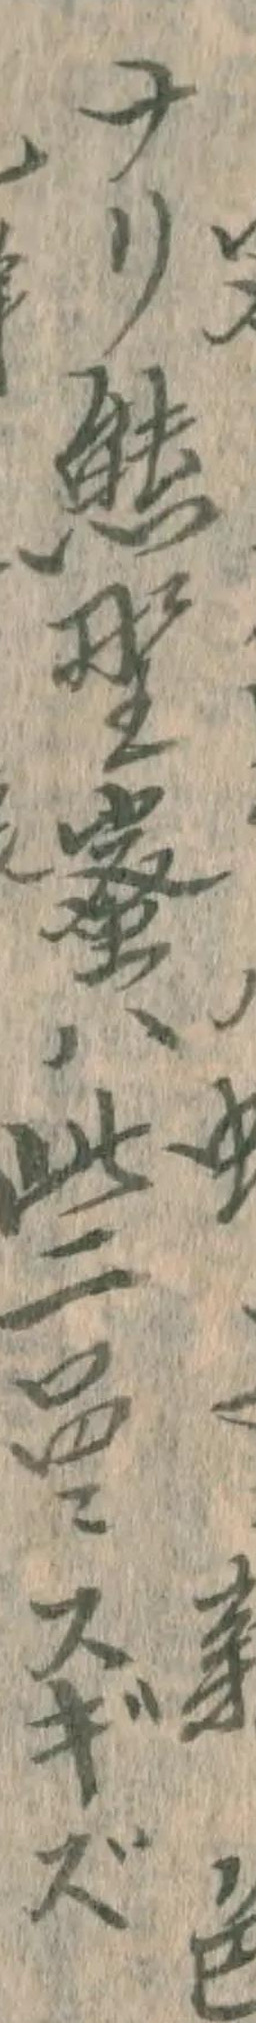ナリ熊野蜜ハ此二品ニスギズ
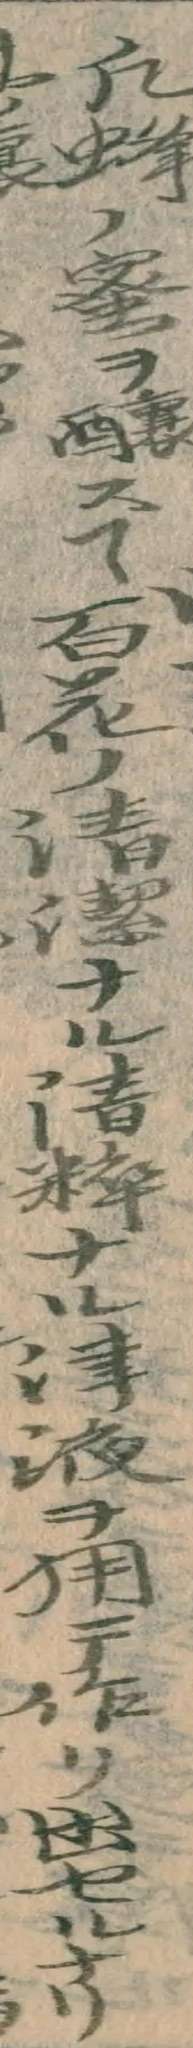凡蜂ノ蜜ヲ醸スコト百花ノ清潔ナル清粹ナル津液ヲ用テ作リ出セルナリ
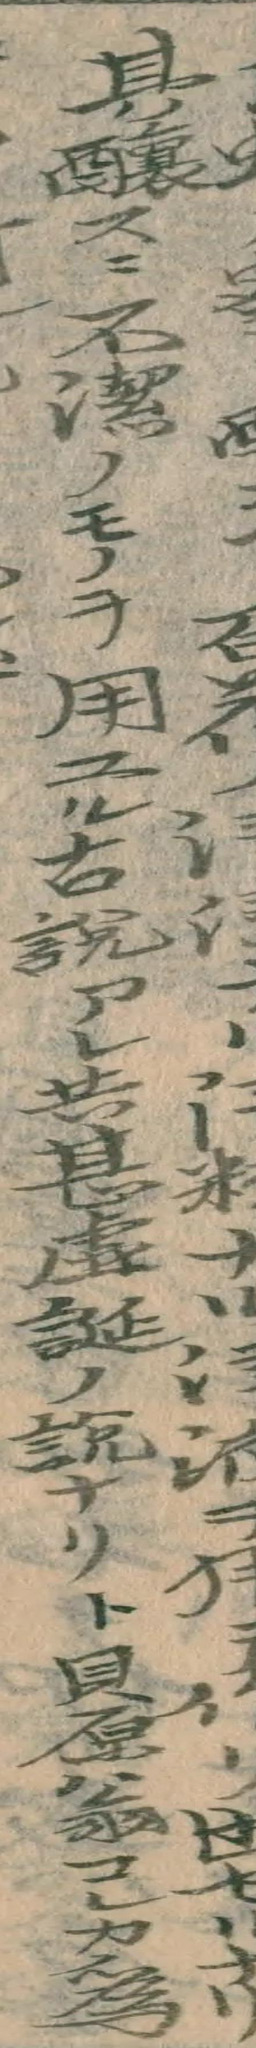其醸スニ不潔ノモノヲ用ユル古説アレ共甚虚誕ノ説ナリト貝原翁コレカ為
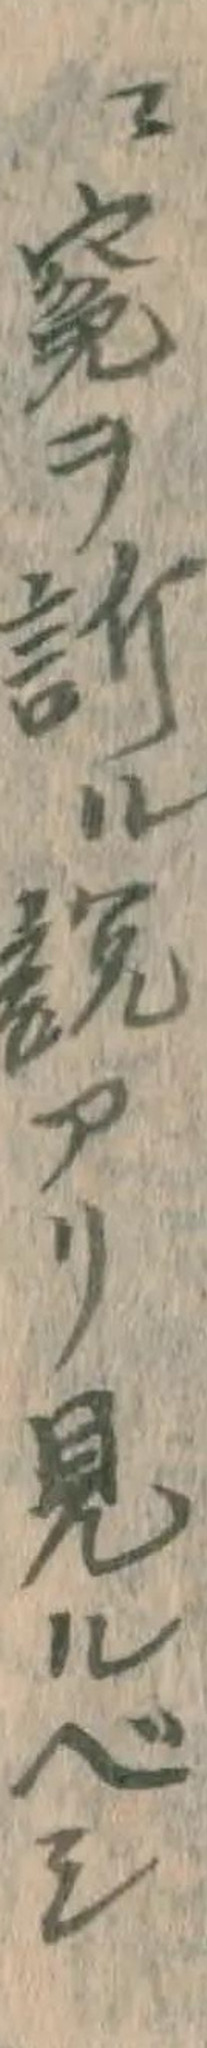ニ冤ヲ訢ル説アリ見ルベシ
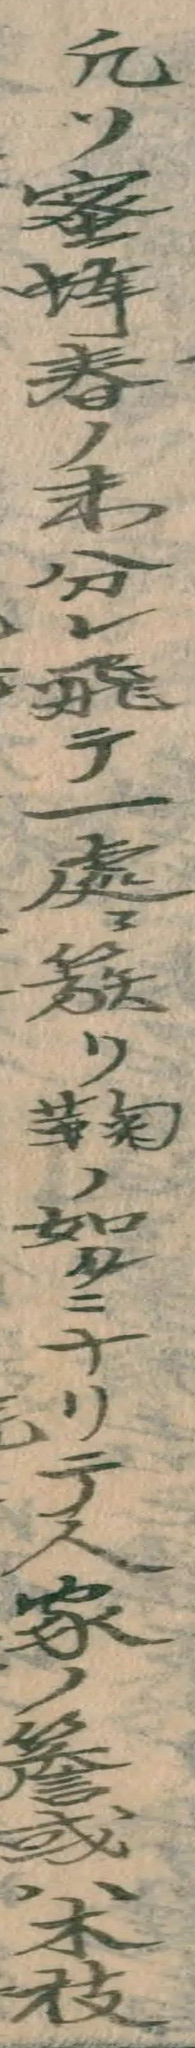凡ソ蜜蜂春ノ末分レ飛テ一處ニ簇リ鞠ノ如クニナリテ人家ノ簷或ハ木枝
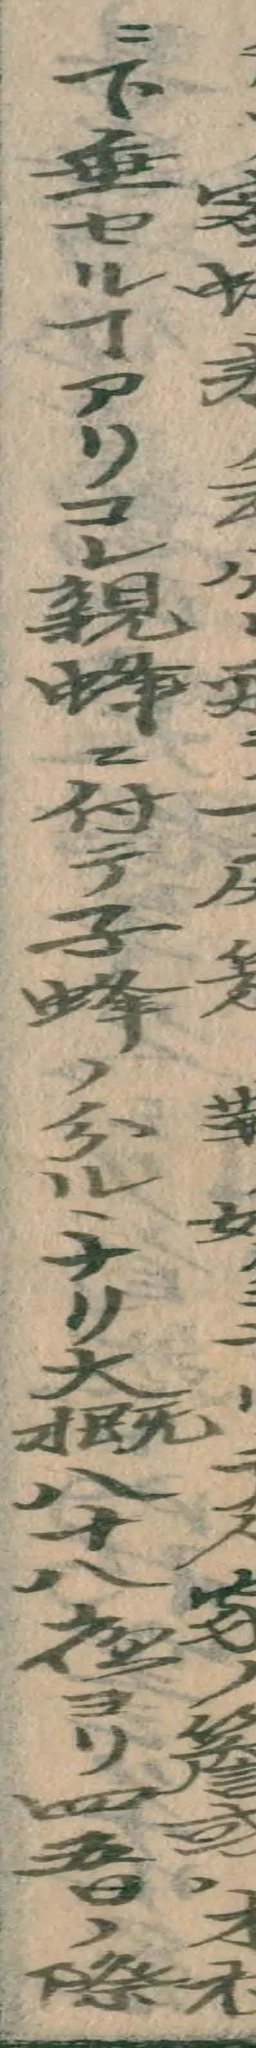ニ下垂セルコトアリコレ親蜂ニ付テ子蜂ノ分ルヽナリ大概八十八夜ヨリ四五日ノ際
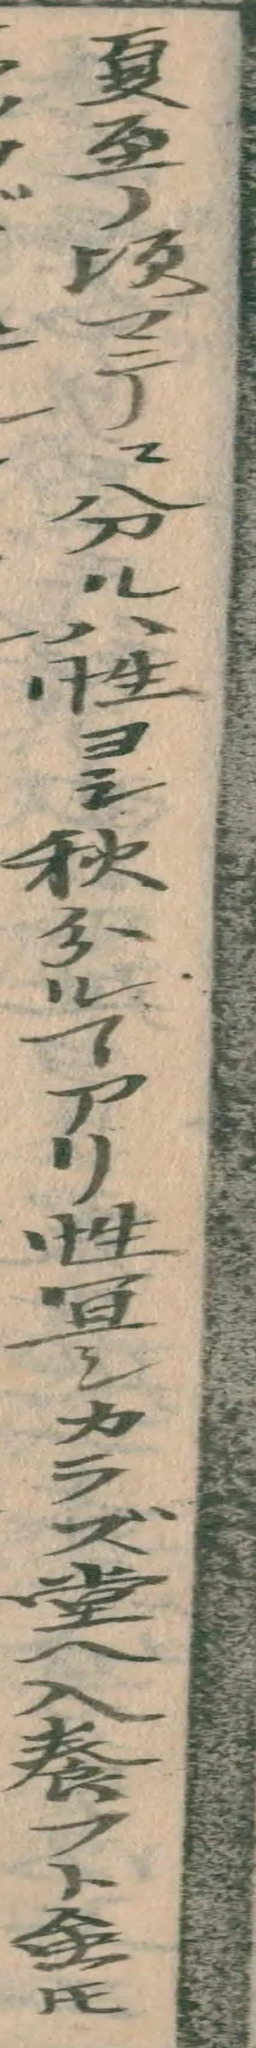夏至ノ頃マテニ分ルハ性ヨシ秋分ルコトアリ性宜シカラズ堂ヘ入養フト雖トモ
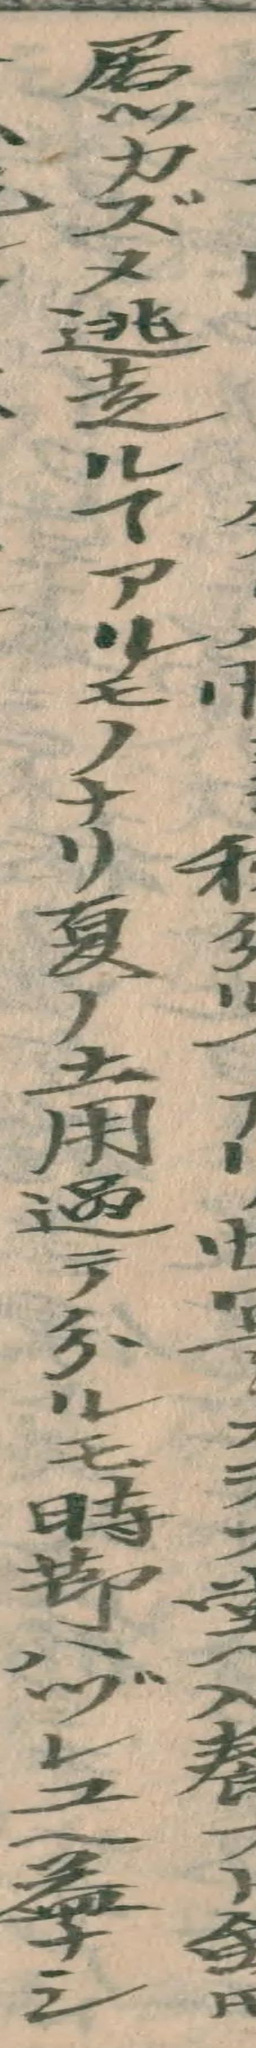居ツカズシテ逃走ルコトアルモノナリ夏ノ土用過テ分ルモ時節ハヅレユヘ益ナシ
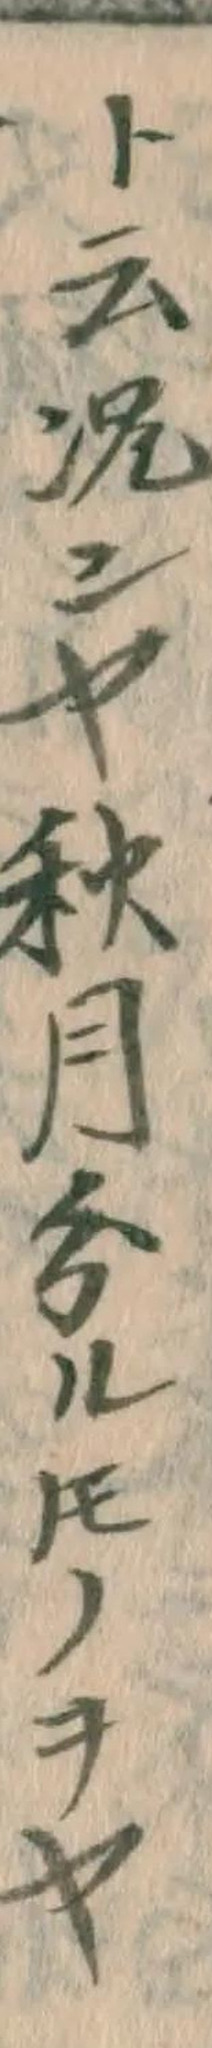ト云況ンヤ秋月分ル𪜈ノヲヤ
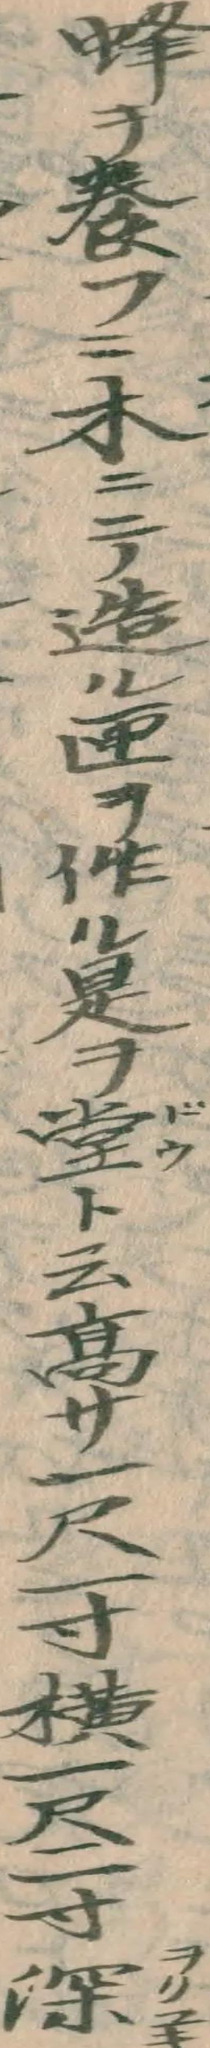蜂ヲ養フニ木ニテ造ル匣ヲ作ル是ヲ堂ト云高サ一尺一寸横一尺二寸深
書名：千蟲譜 3巻. [1]
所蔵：国立国会図書館 National Diet Library, JAPAN
